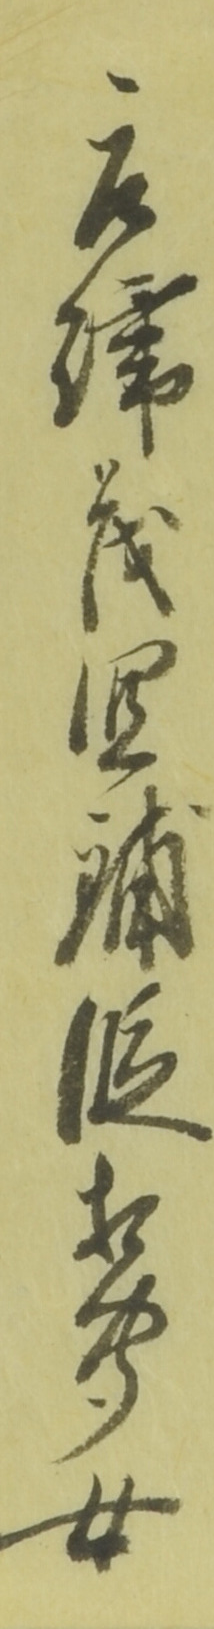取締も宜鋪段相聞女
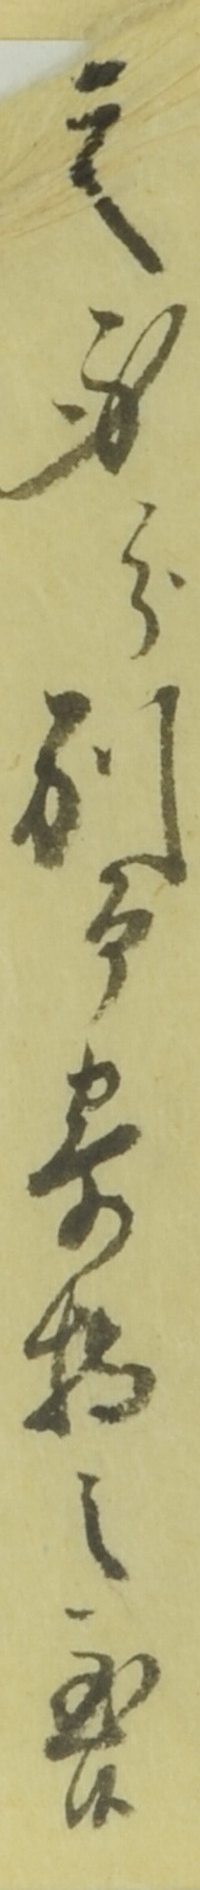之身分別而奇特之至候

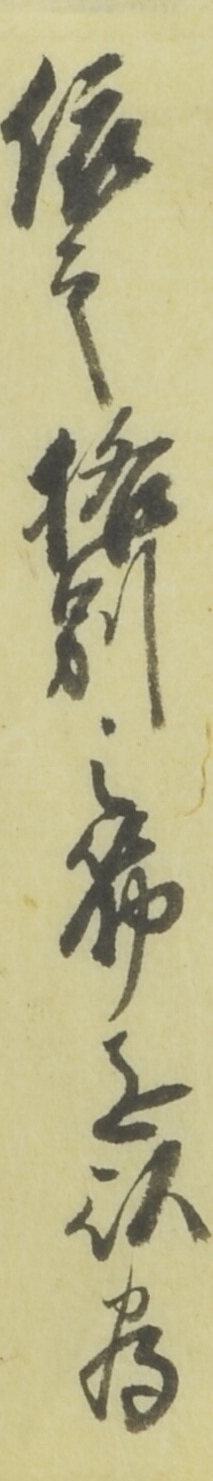依之格別之筋を以為
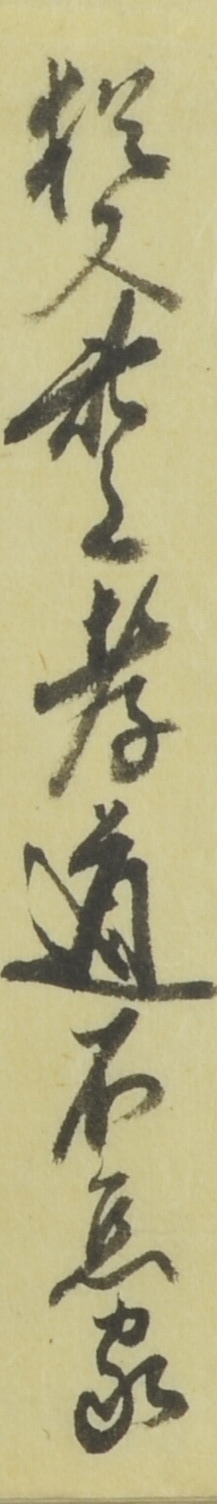猶又此上孝道不怠家
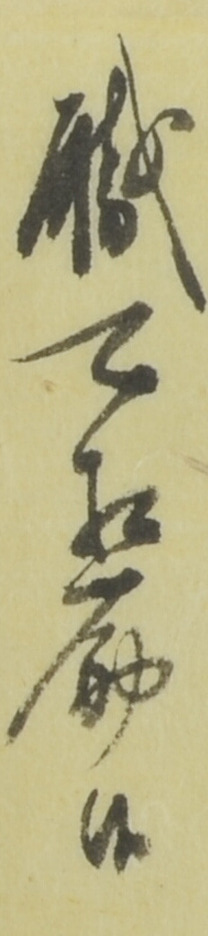職可相励候
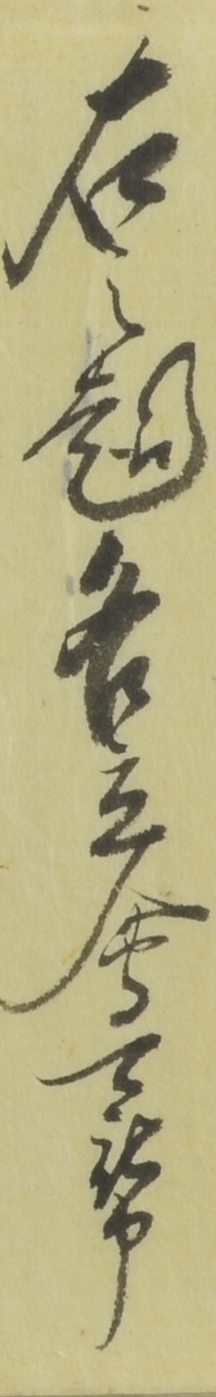右之趣各立会可被申
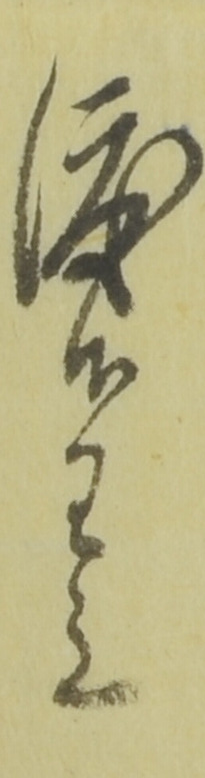渡候已上
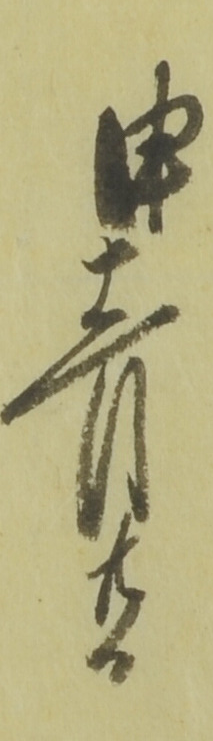申十二月廿日
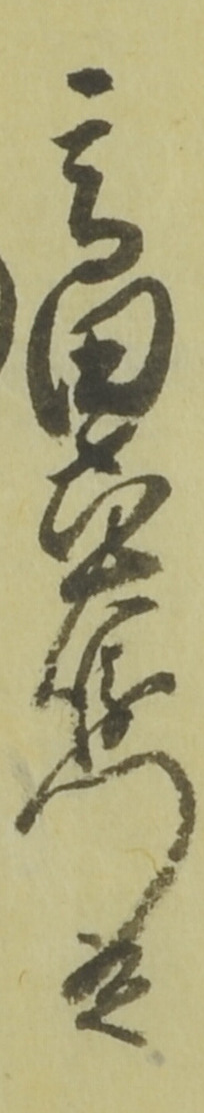高田六右衛門殿
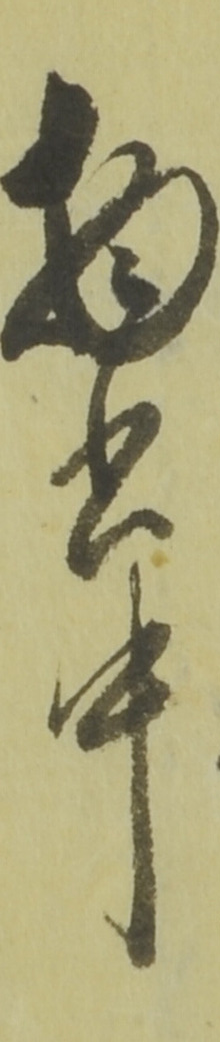物書中
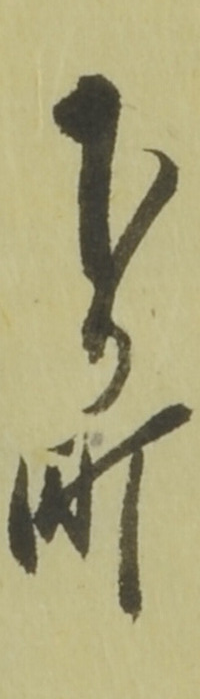下り町
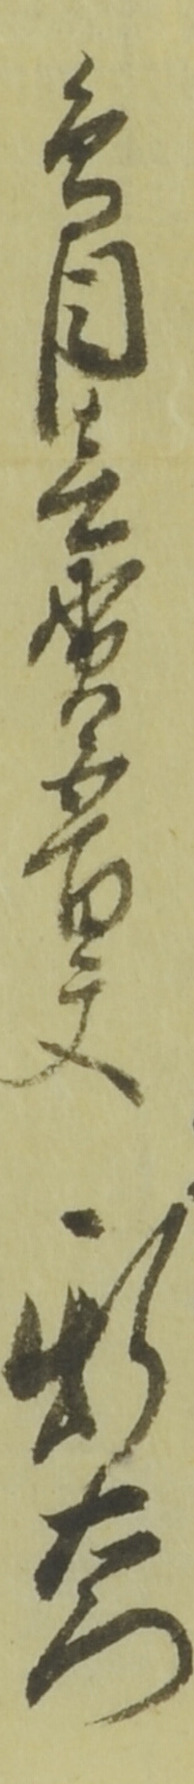鳥目壱貫五百文新右衛門
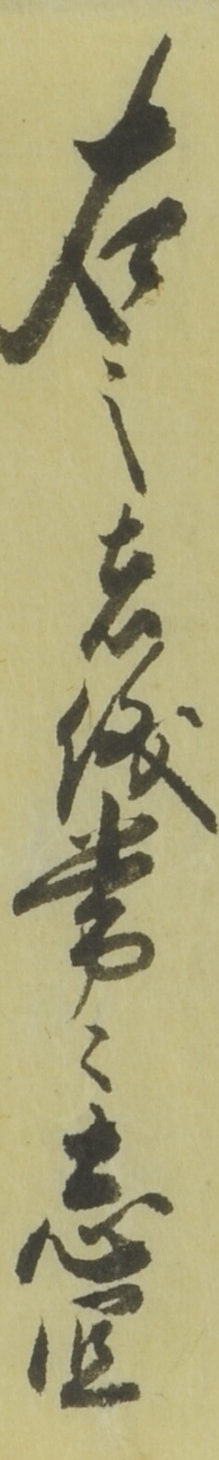右之者儀常々志宜
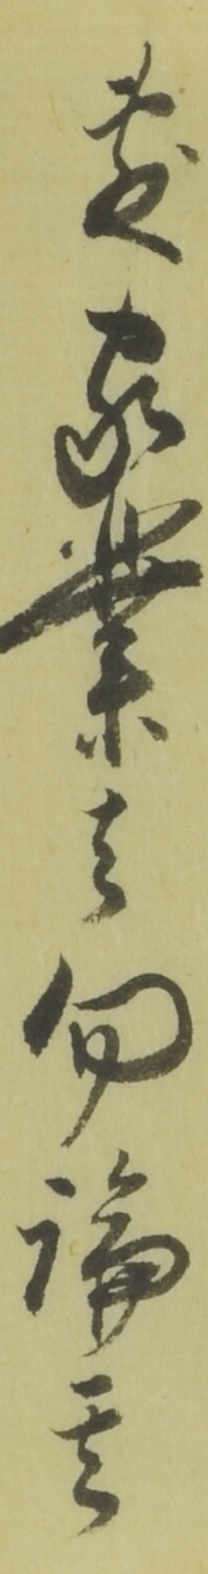敷家業は勿論其
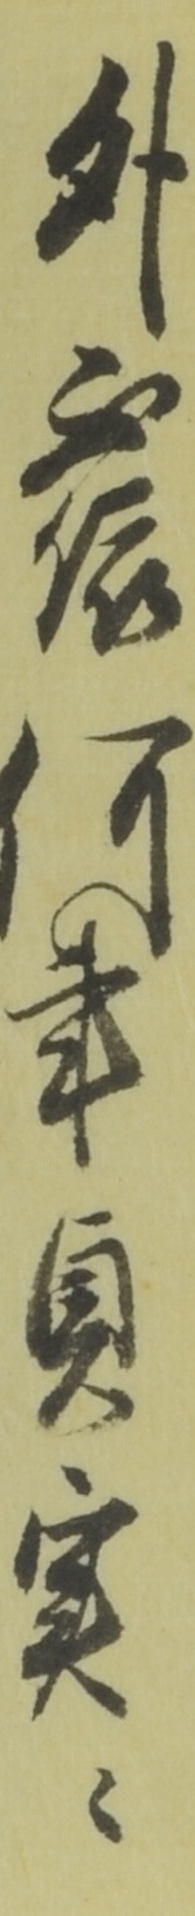外不依何事貞実ニ
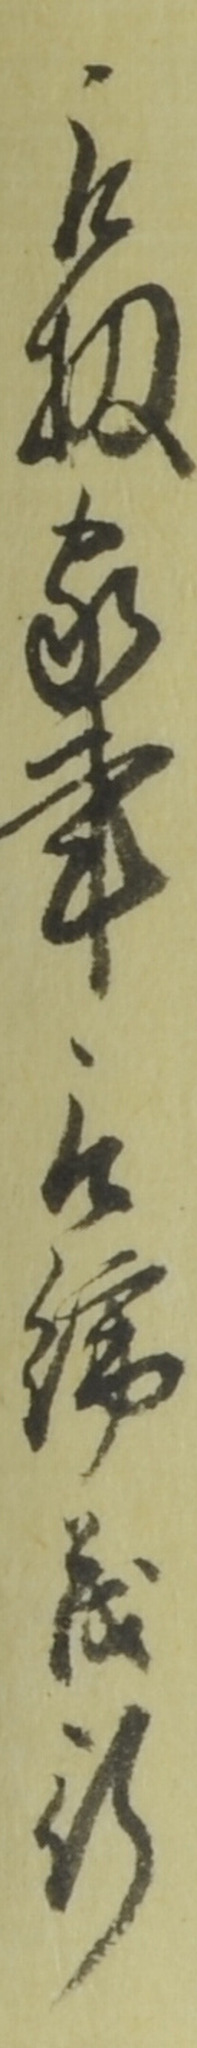取扱家事取締も行
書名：御触書御書附控
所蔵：伊那市立高遠町図書館・合同会社AMANE
